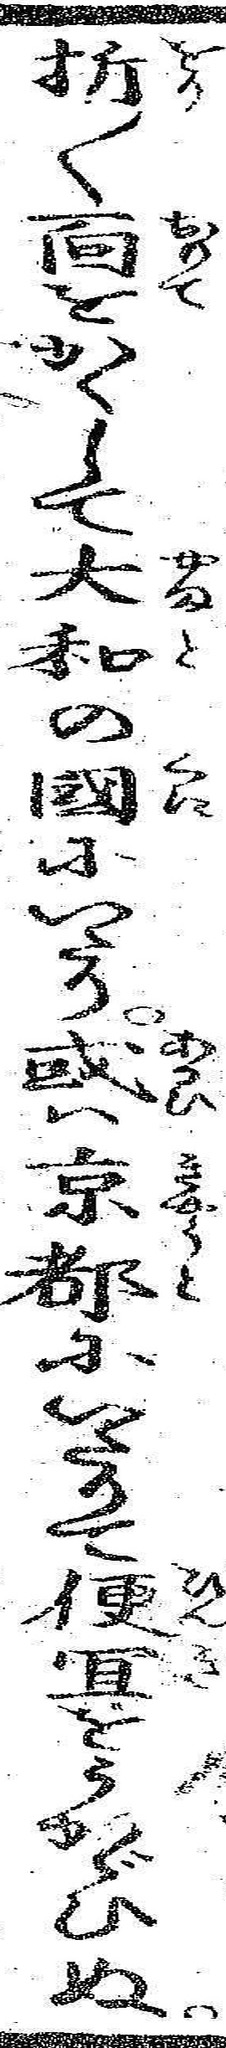折々面をかくして大和の国にいたり。或は京都にいたりて便宜をうかゞひぬ。
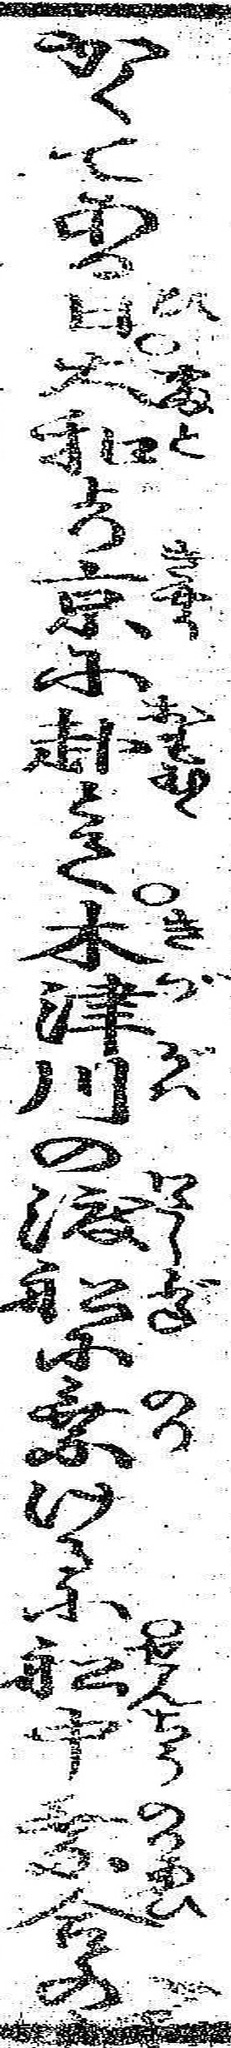かくてある日。大和より京に赴とて。木津川の渡船に乗けるに。船中乗合の
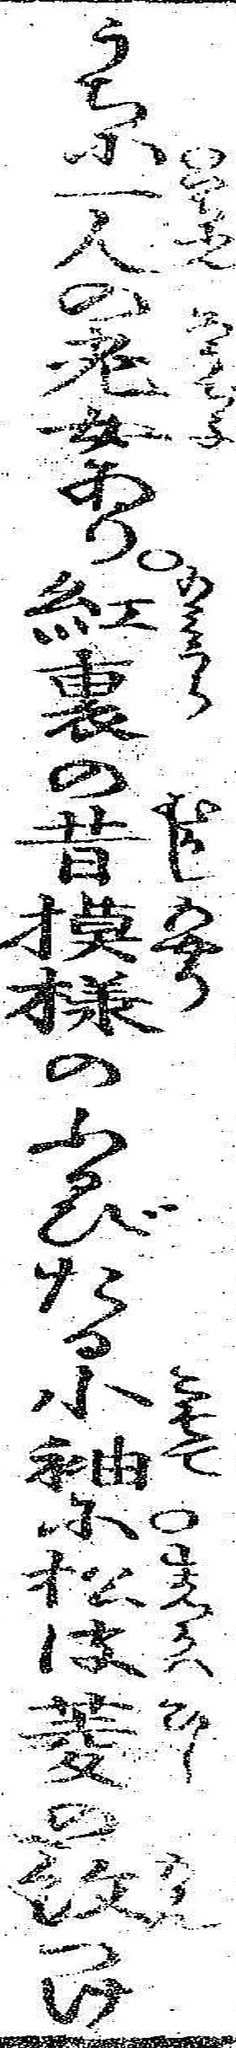うちに。一人の老女あり。紅裏の昔模様のふるびたる小袖に。松皮菱の紋つけ
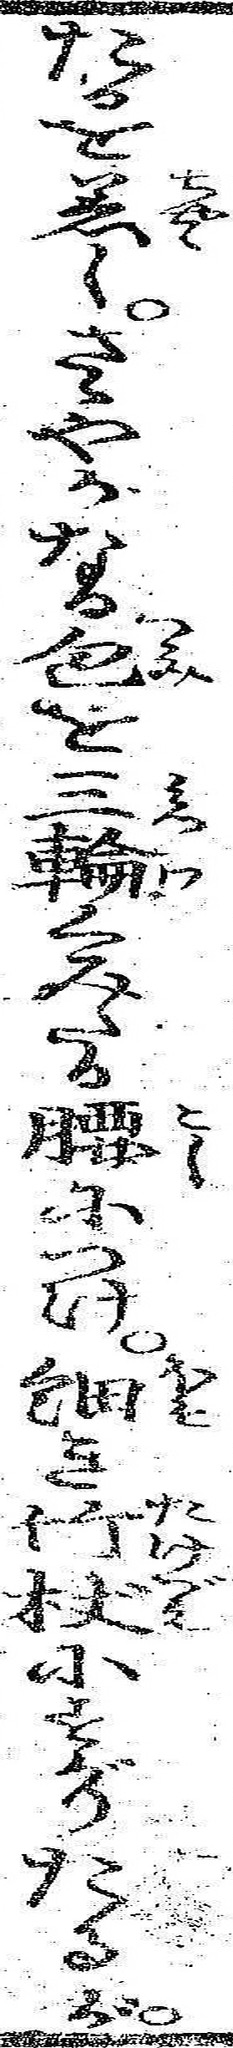たるを着し。さゝやかなる包を三輪くみたる腰につけ。細き竹杖にすがりたるが。
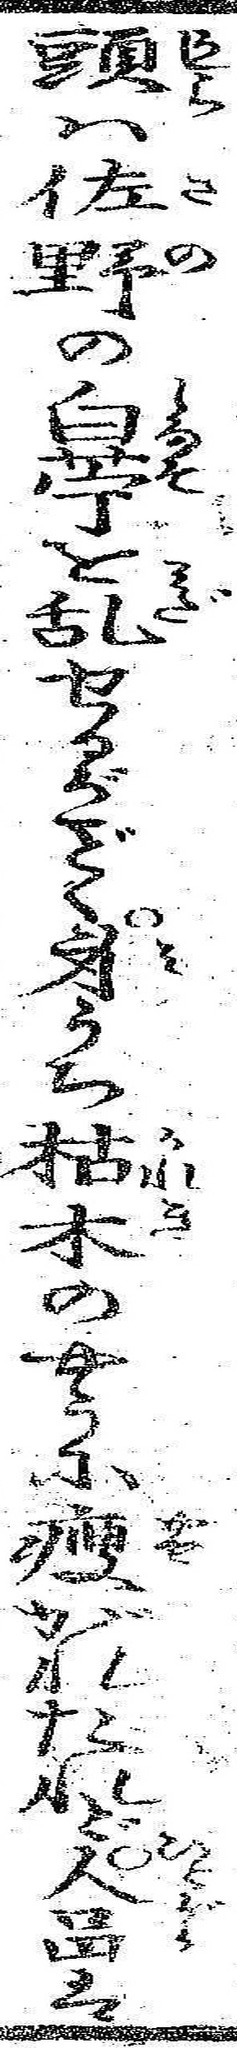頭は佐野の白苧を乱せるがごとく。身うち枯木のやうに痩がれたれど。人品は
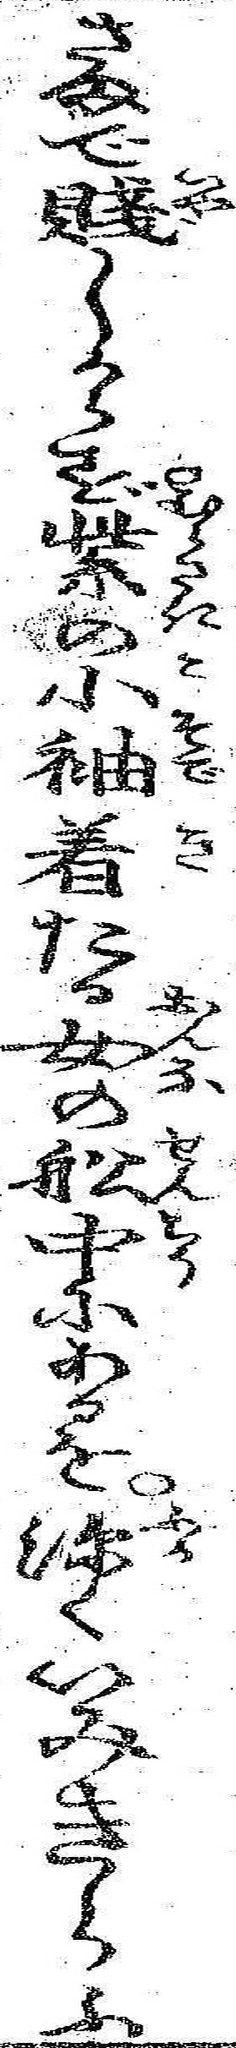さまで賎しからず。紫の小袖着たる女の船中にあるを。深くいみきらふ
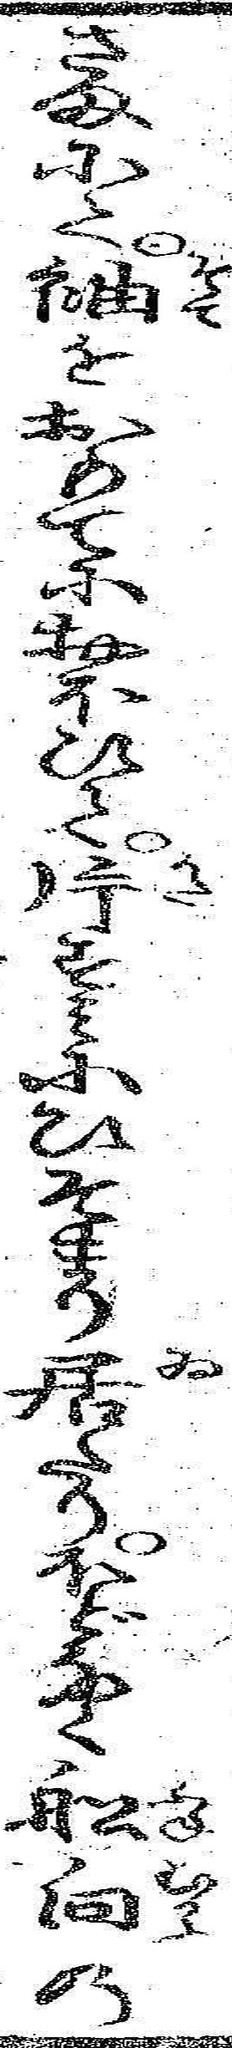さまにて。袖をおもてにおほひて。片すみにひそまり居たり。ほどなく船向の
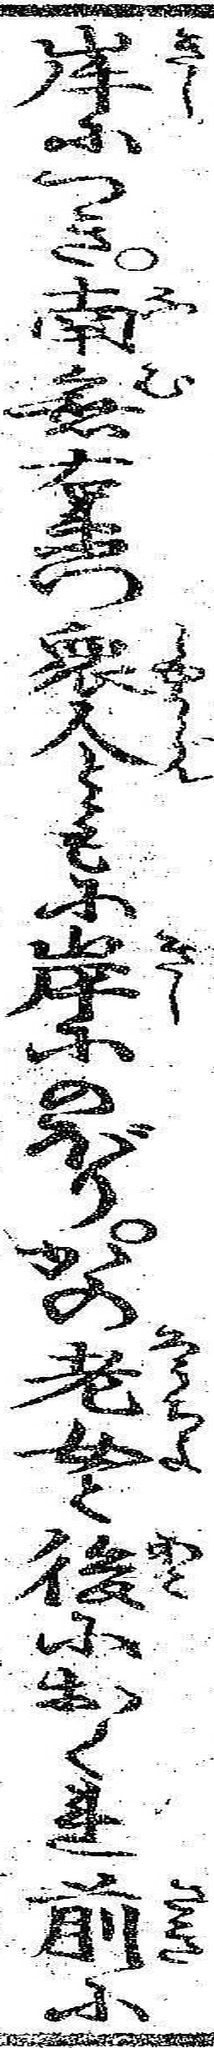岸につき。南無右衛門衆人とゝもに岸にのぼり。かの老女と後におくれ前に
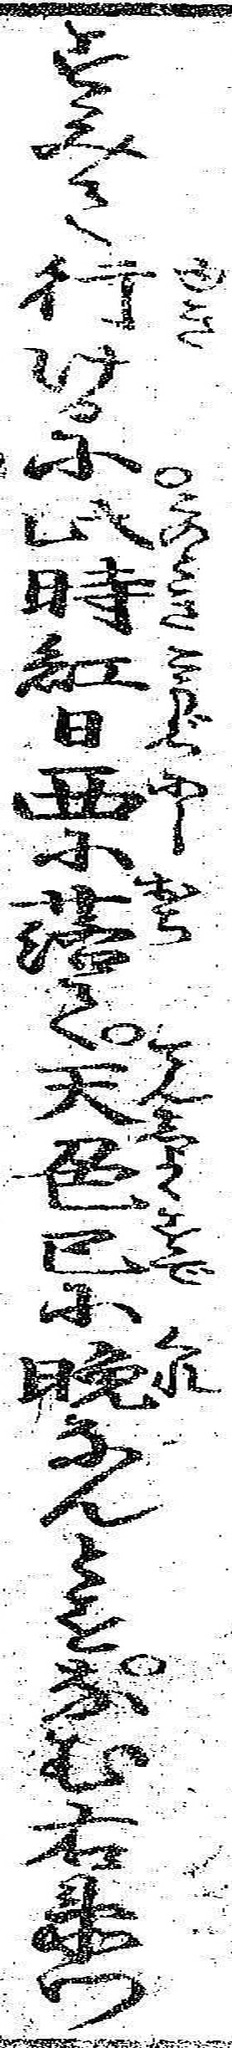すゝみて行けるに。此時紅日西に落て。天色已に晩なんとす。なむ右衛門
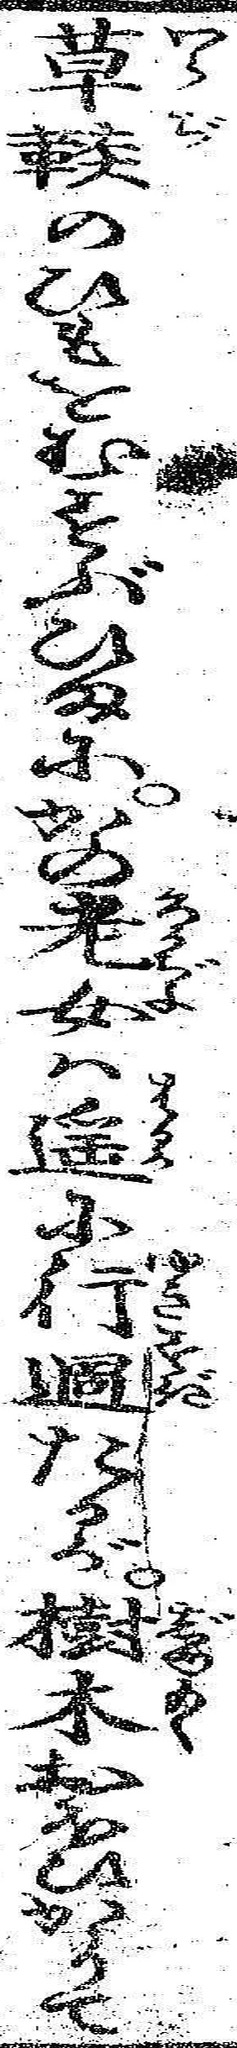草鞋のひもをむすぶひまに。かの老女は遥に行過たるが。樹木おほひかゝりて
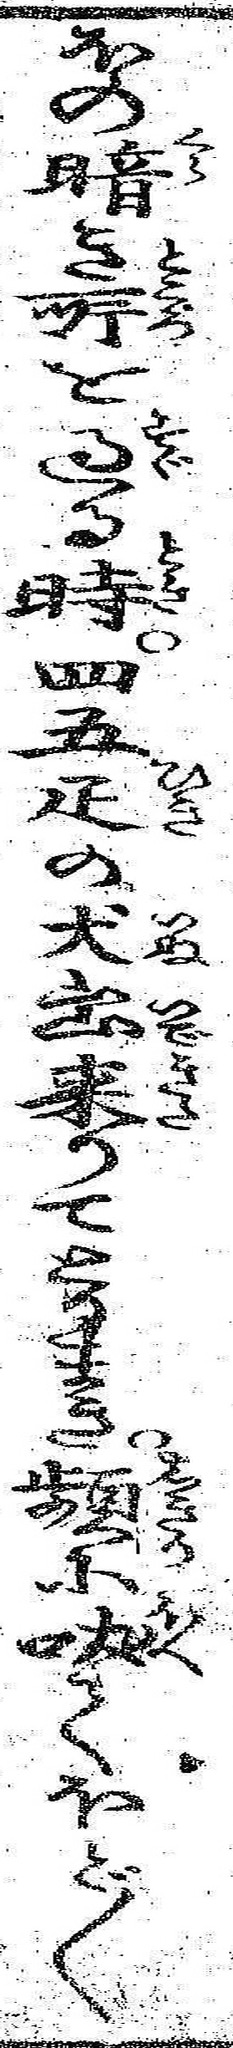ほの暗き所を過る時。四五疋の犬出来りてとりまき。頻に吠てほど〳〵
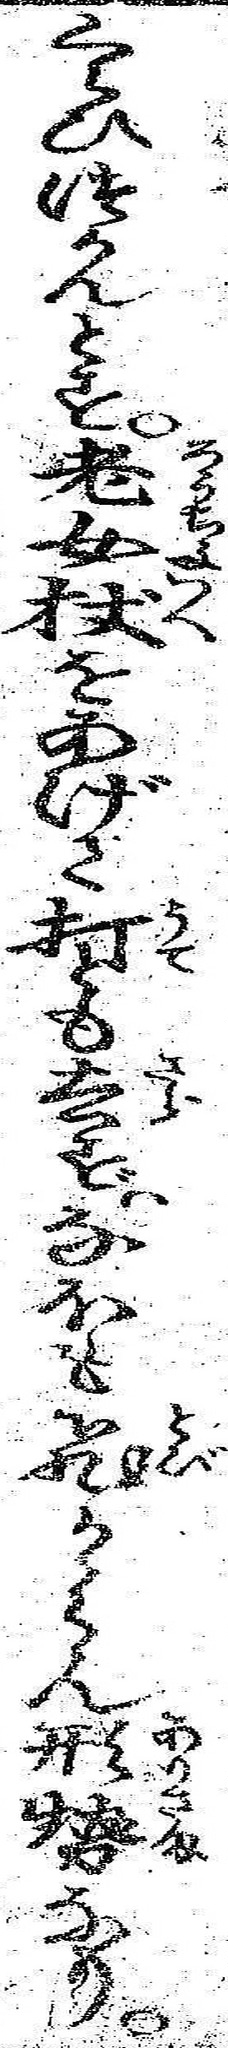くらひつかんとす。老女杖をあげて打とも去ず。なほも飛かゝらん形勢なり。

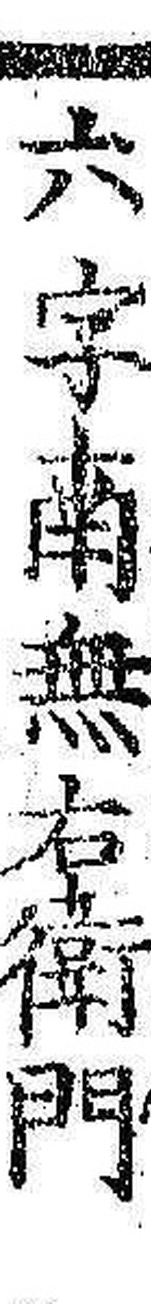六字南無右衛門
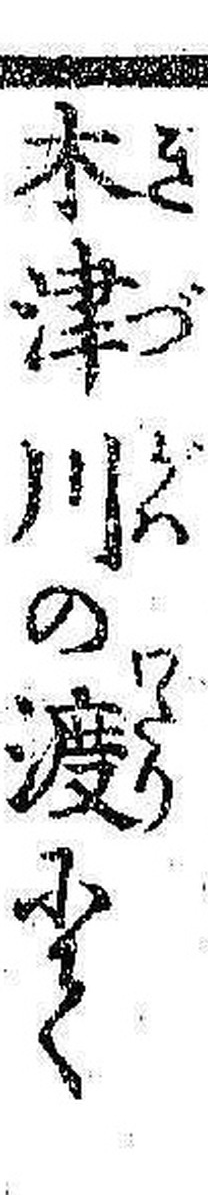木津川の渡にて
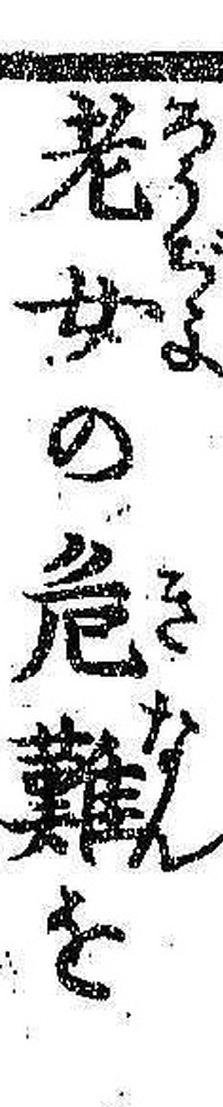老女の危難を
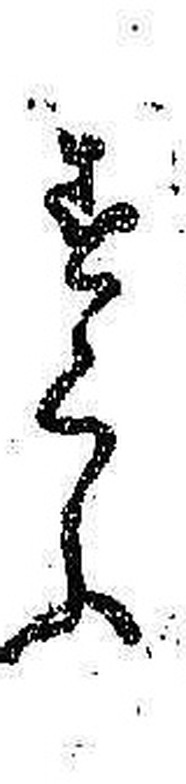すくふ
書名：昔話稲妻表紙
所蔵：国文学研究資料館
